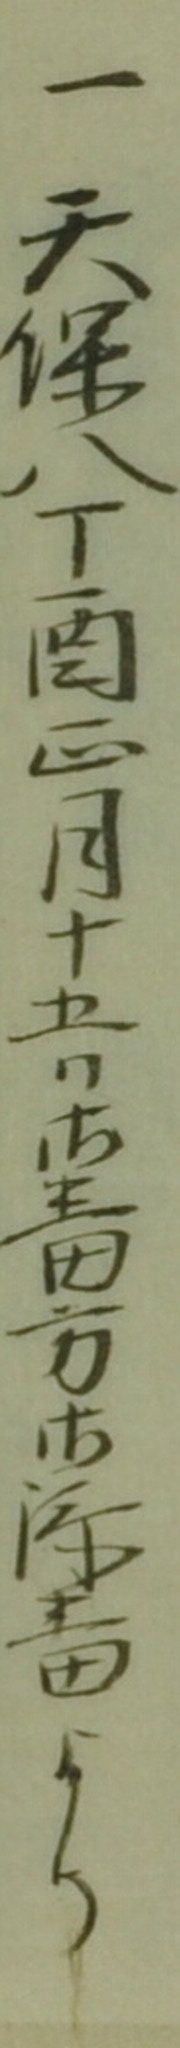一天保八丁酉正月十五日御番方御添伴より
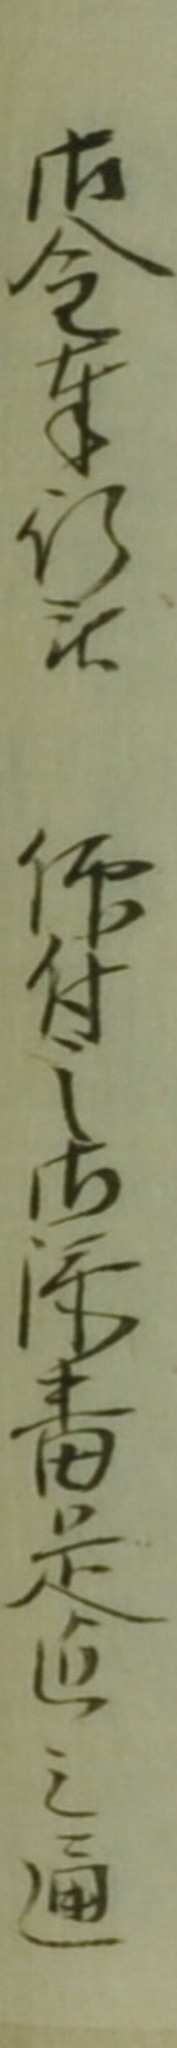御金奉行被仰付之御添伴是迄之通
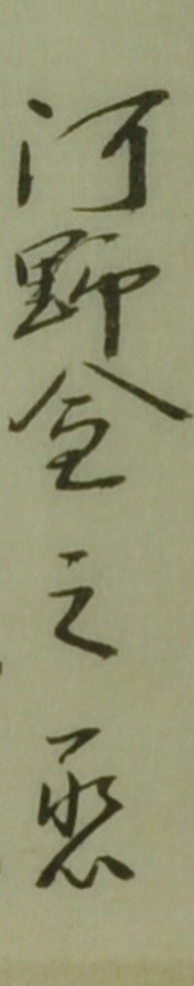河野金之丞
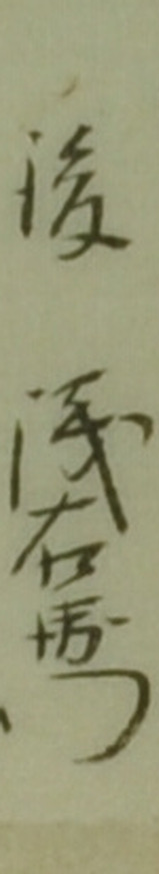後浅右衛門
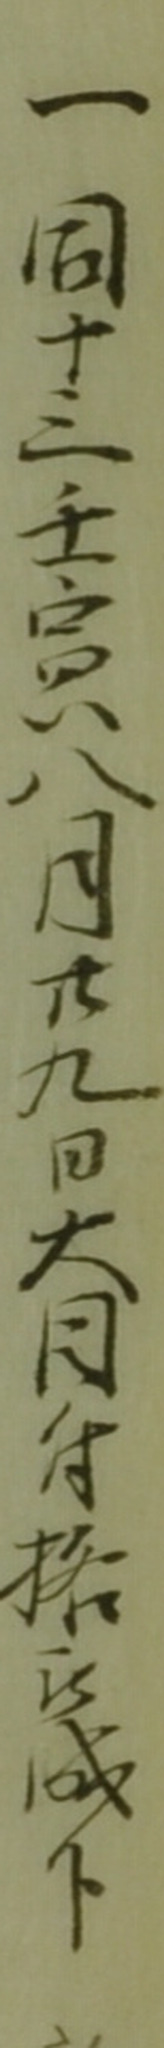一同十三壬寅八月廿九日大目付格被成下
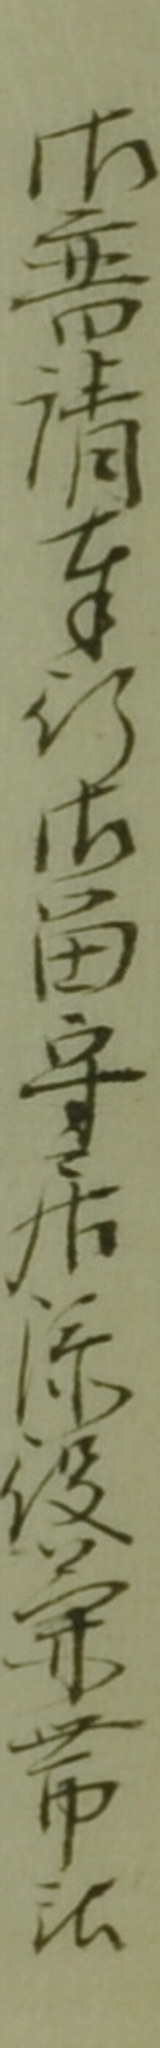御普請奉行御留守居添役兼帯被
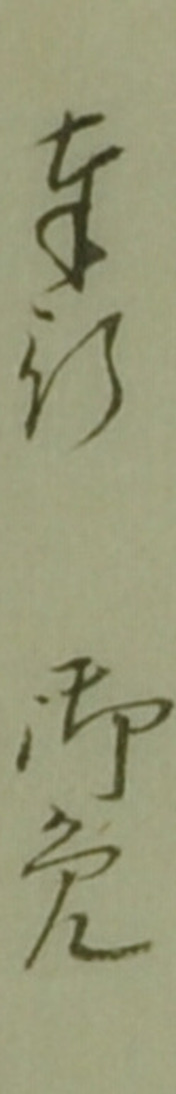奉行御免
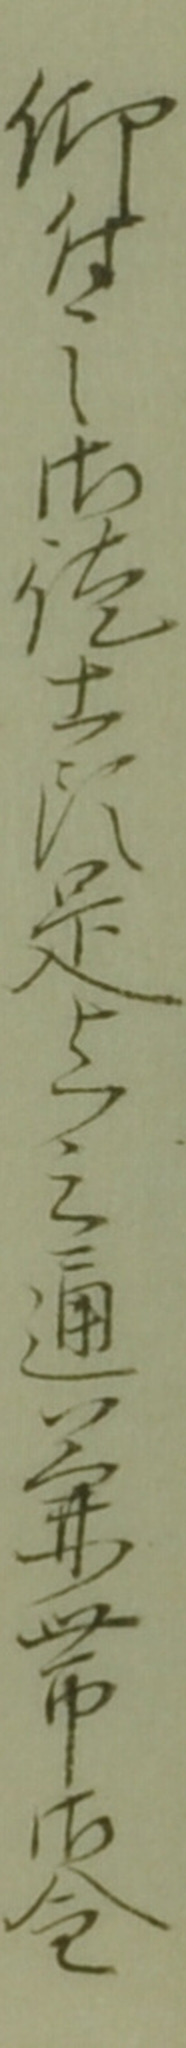仰付之御徒士頭是迄之通兼帯御金
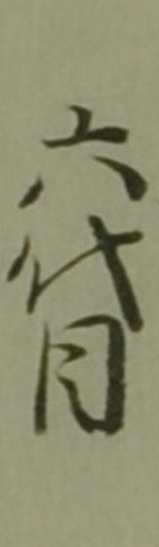六代目
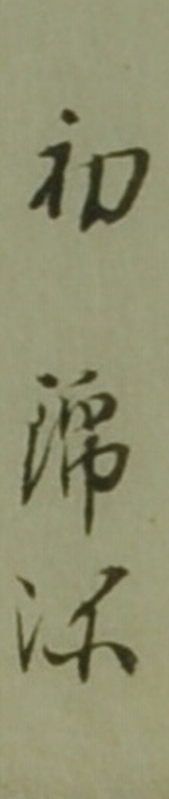初錦弥
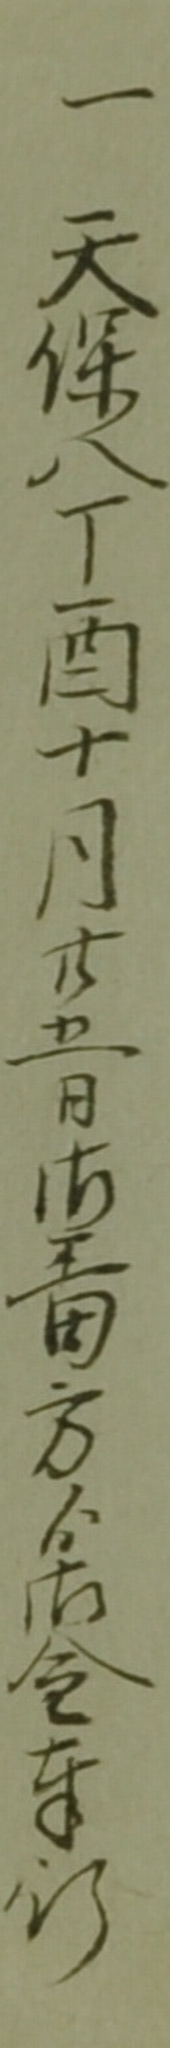一天保八丁酉十月廿五日御番方ゟ御金奉行
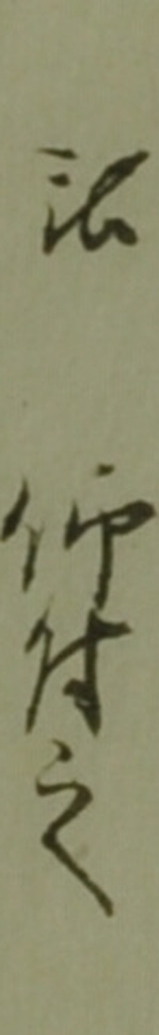被仰付之
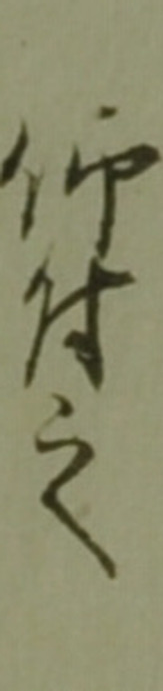仰付之
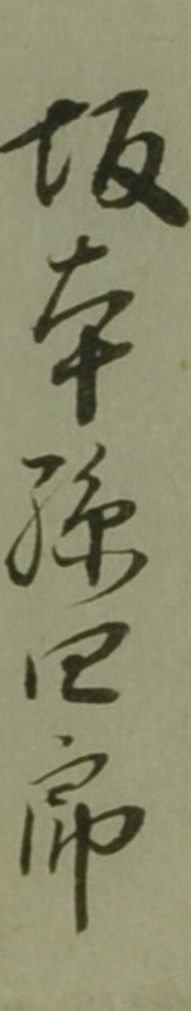坂本孫四郎
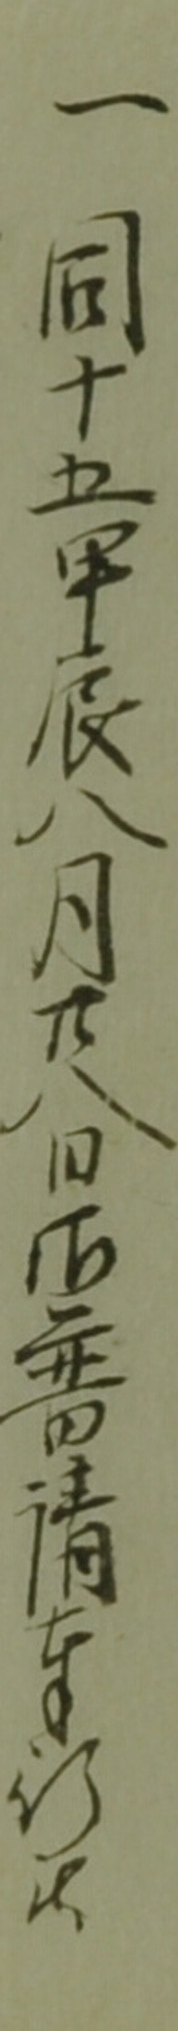一同十五甲辰八月廿八日御普請奉行被
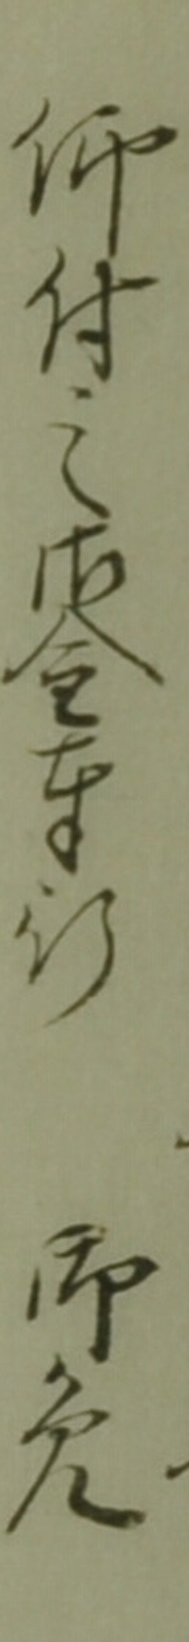仰付之御金奉行御免
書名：諸御役代々録（七）
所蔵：伊那市立高遠町図書館・合同会社AMANE
